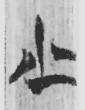少
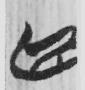臣
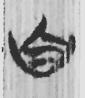自
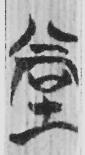堂
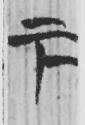下
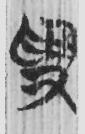受
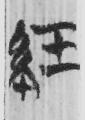紝
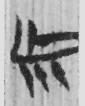巟
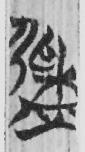{弓采皿}
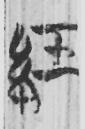紝
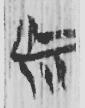巟
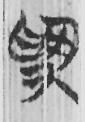受
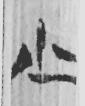少
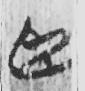臣
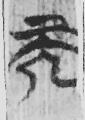而
